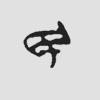民
